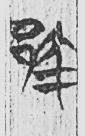○（蔡）
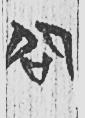卲
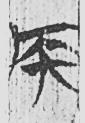侯
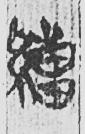{糸東田}
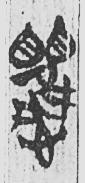懼
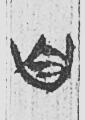自
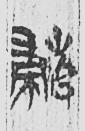{𡴎帚}
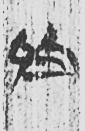於
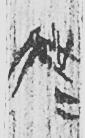吳=
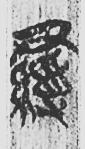縵
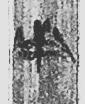用
